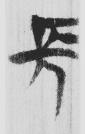長
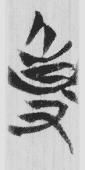事
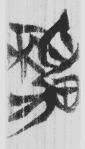{來耒田}
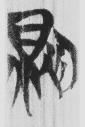則
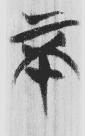不
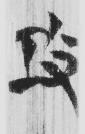攻
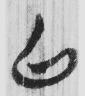㠯（以）
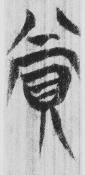賞
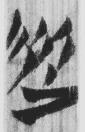從
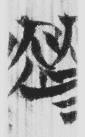火火衣=
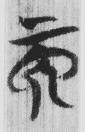而
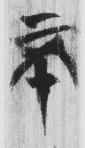不
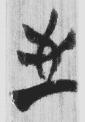至
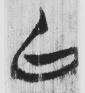㠯（以）
